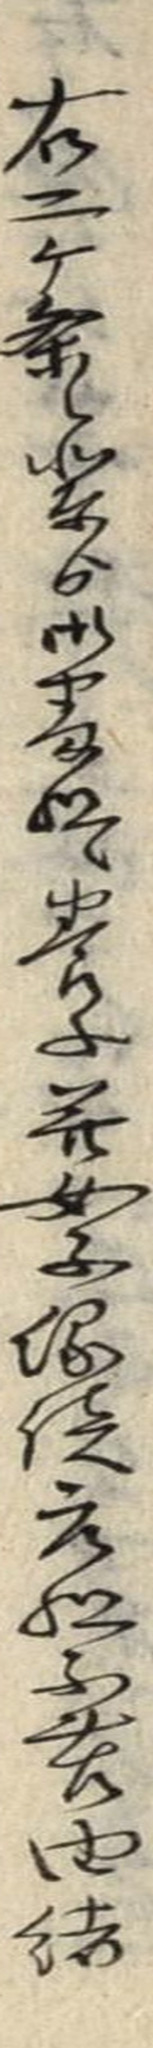右二ヶ条之輩ゟ御番組ヘ養子并女子縁談取組不苦由緒
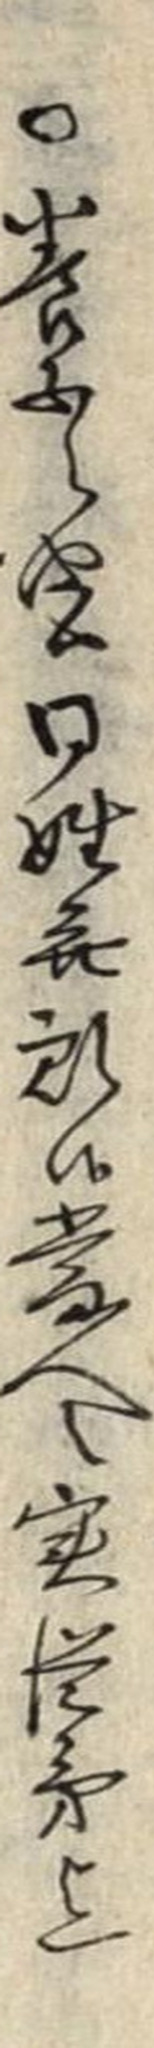○養子之儀ハ同姓并願候当人之実弟迄
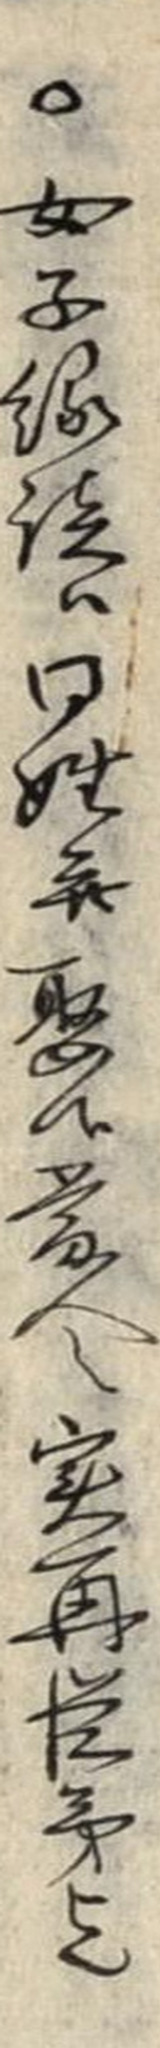○女子縁談ハ同姓并娶候当人之実再従弟迄
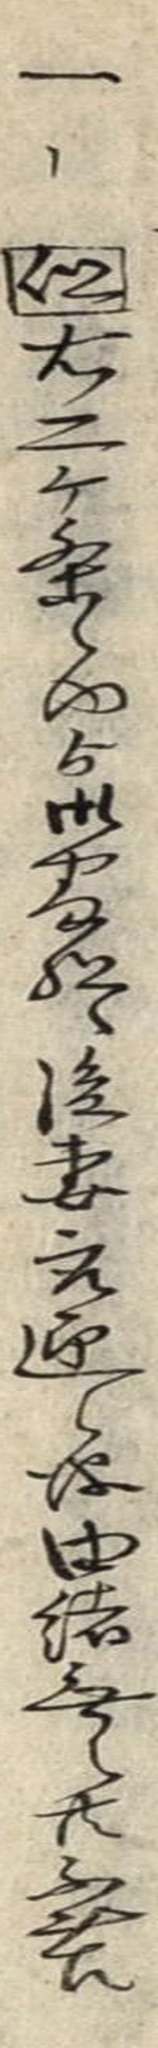一但右二ヶ条之内ゟ御番組ヘ後妻取迎候儀由緒無之共不苦
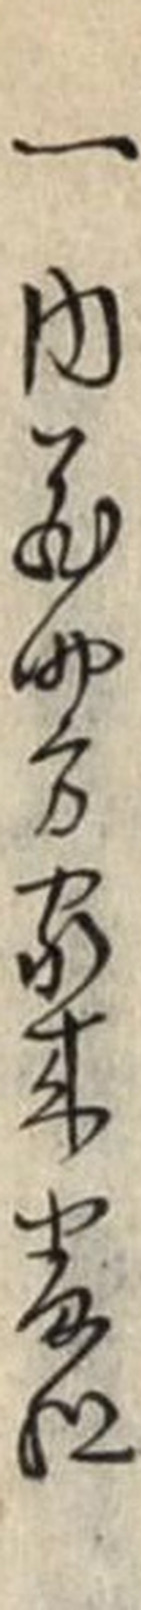一内蔵助方家来番組
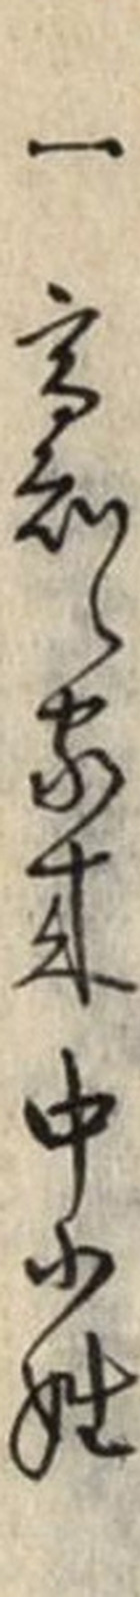一高知之家来中小姓
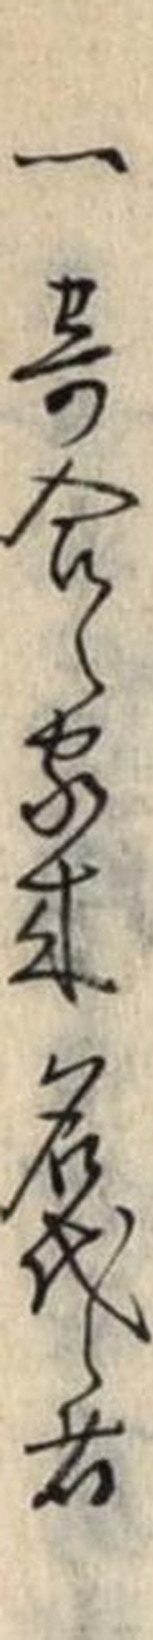一寄合之家来名代之者
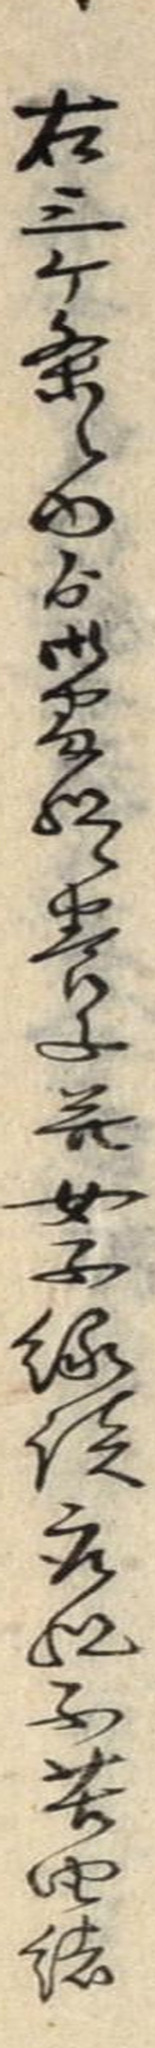右三ヶ条之内ゟ御番組へ養子并女子縁談取組不苦由緒

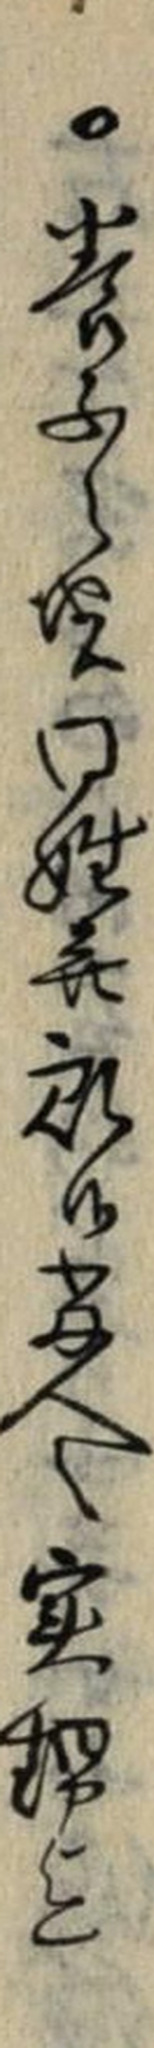○養子之儀ハ同姓并願候当人之実甥迄
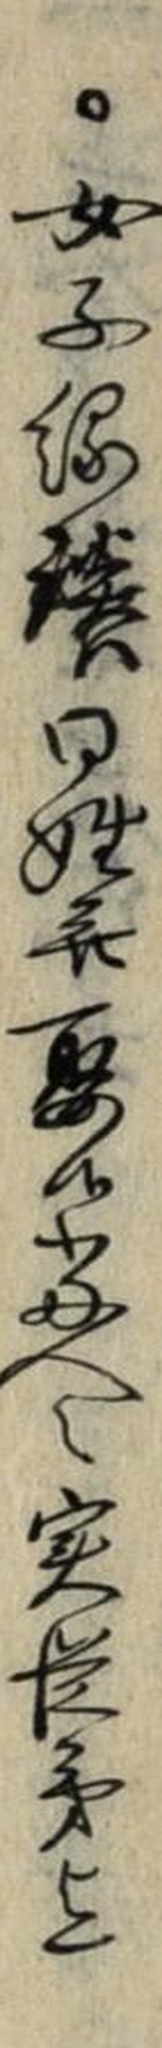○女子縁談ハ同姓并娶候当人之実従弟迄
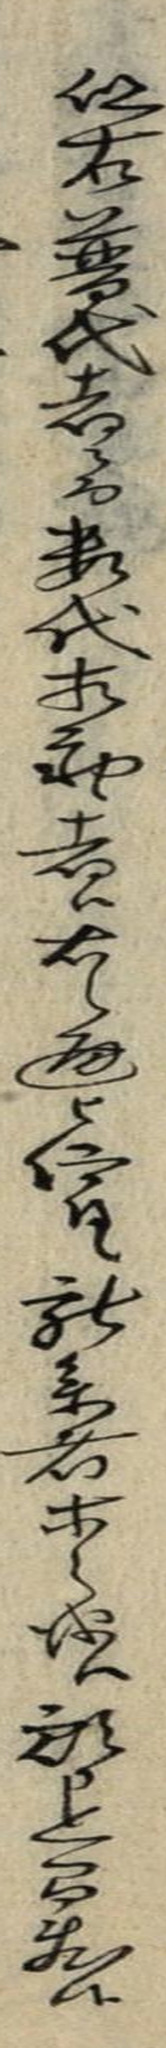但右普代者ニ而数代相勤候者ハ右之通被仰付候新参者等之儀ハ願申上間敷候
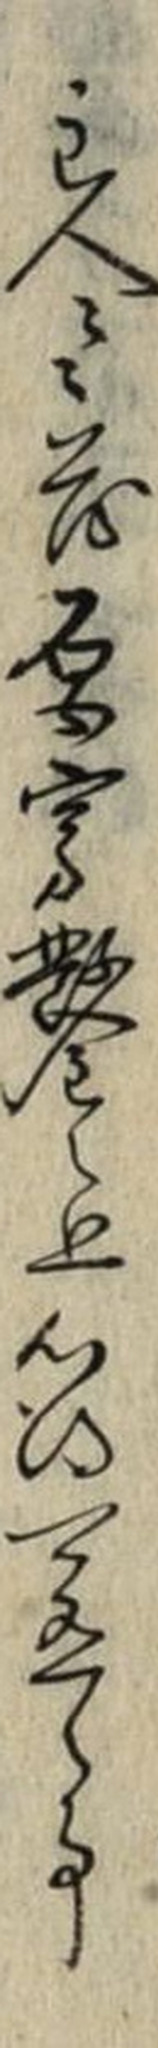主人々々茂厚穿鑿之上心得可有之事
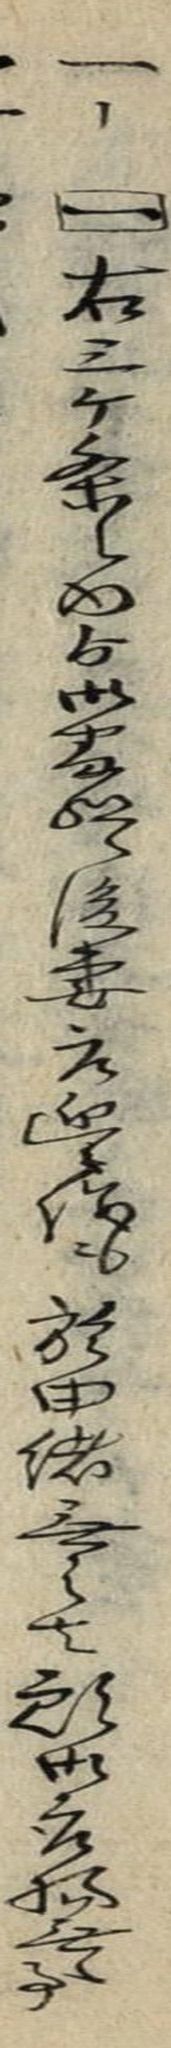一右三ヶ条之内ゟ御番候事組へ後妻取迎儀も於由緒無之者願御取揚無之事
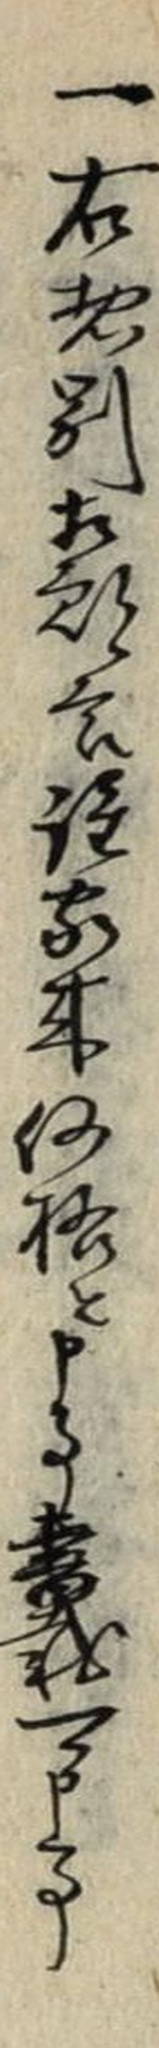一右惣別相願候節誰家来何格と申事書戴可申事
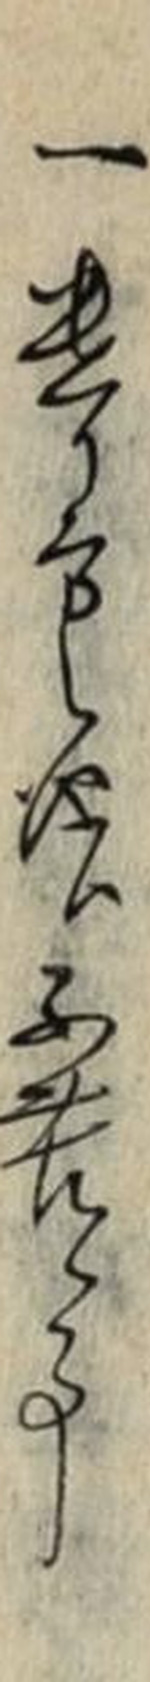一遣り方之儀ハ不苦候事
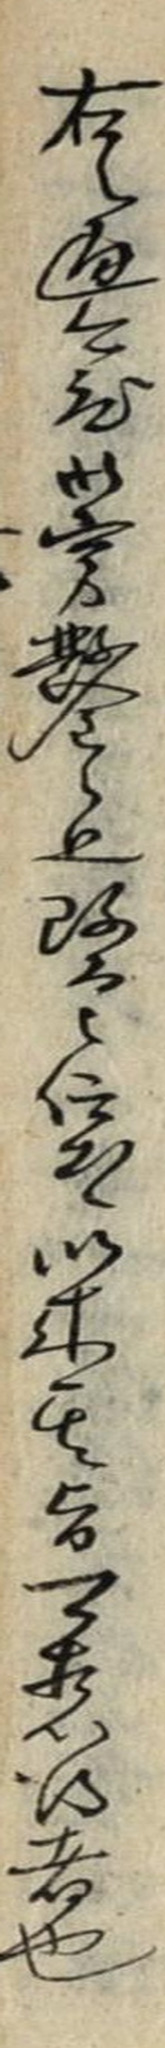右之通今度御穿鑿之上改而被仰出候以来其旨可相心得者也
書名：養子縁組之部
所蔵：福井県文書館 Fukui Prefectural Archives
